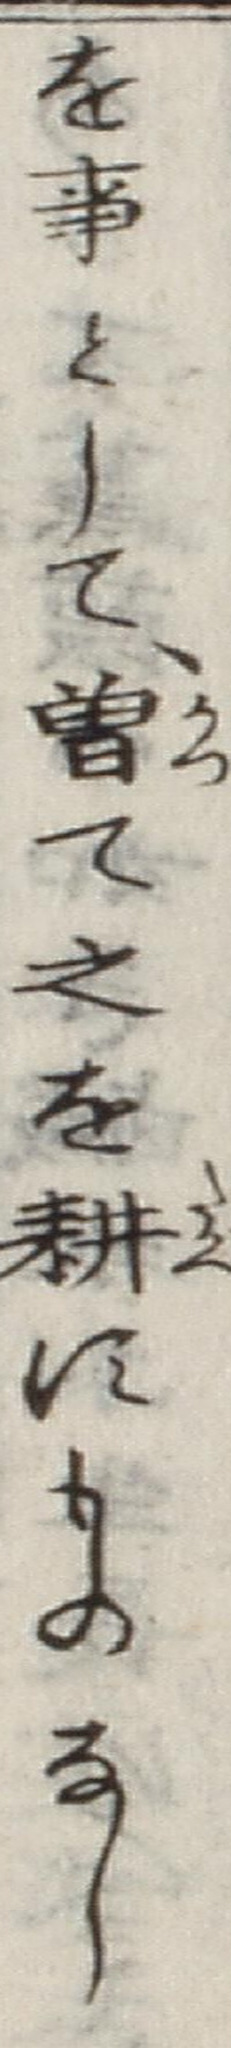を事として、曽て之を耕すものなし
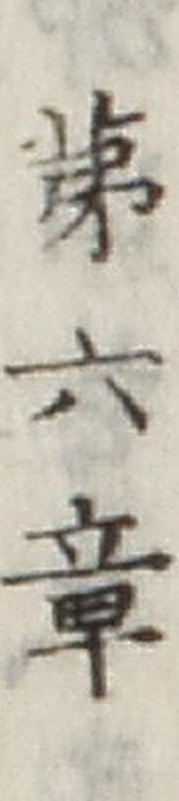第六章
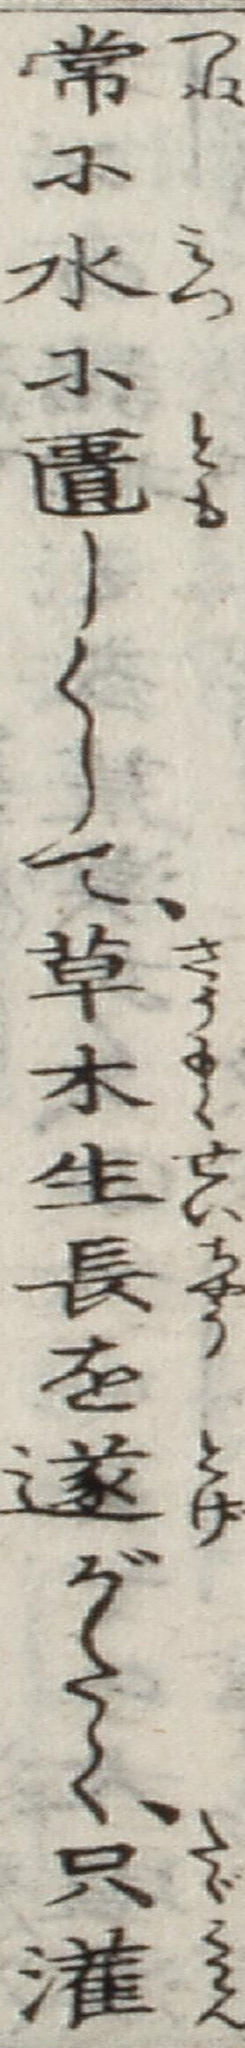常に水に匱しくして、草木生長を遂がたく、只灌
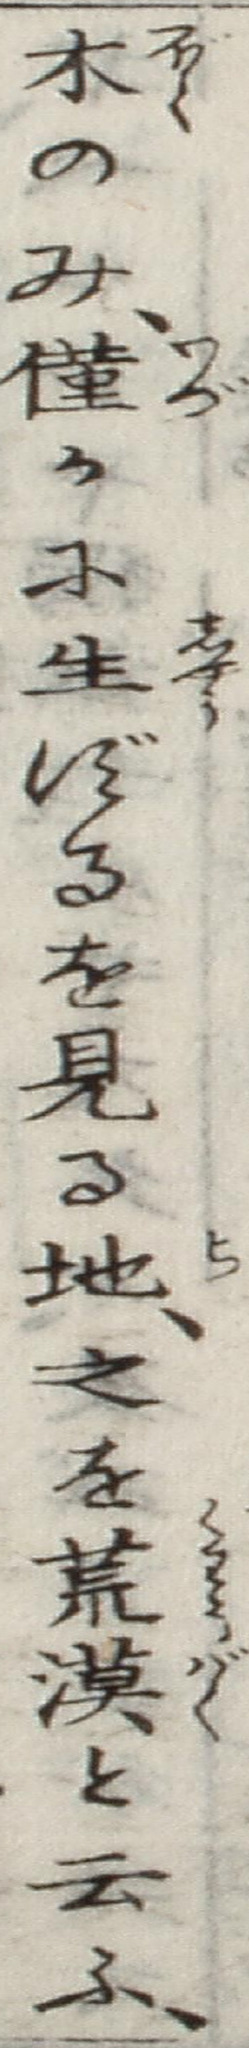木のみ、僅かに生ずるを見る地、之を荒漠と云ふ、
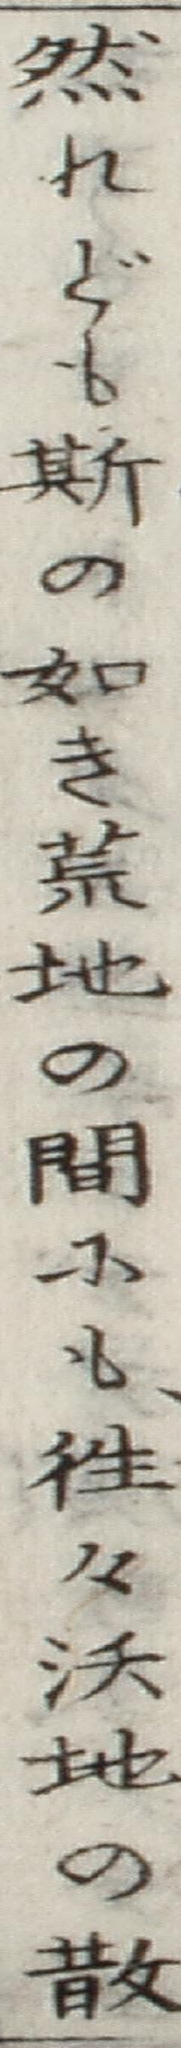然れども斯の如き荒地の間にも往々沃地の散
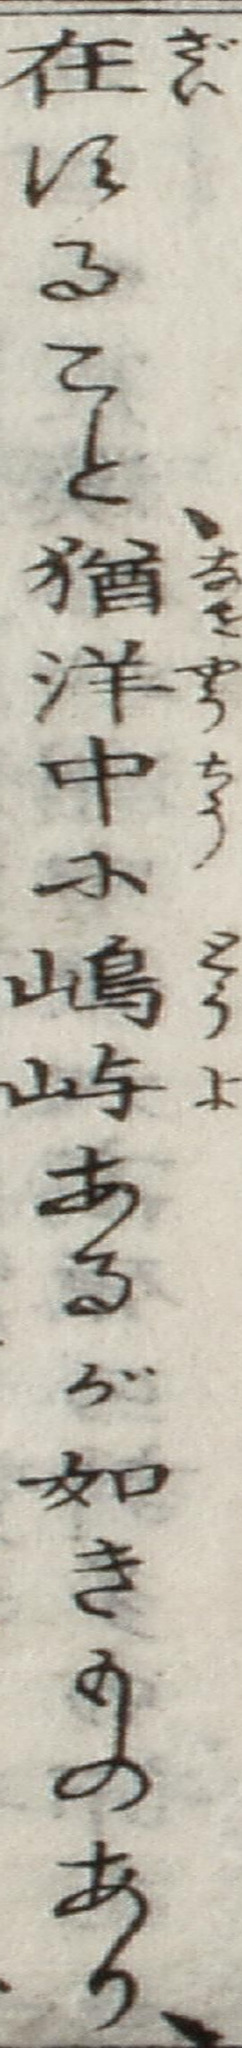在すること、猶洋中に島嶼あるが如きものあり、
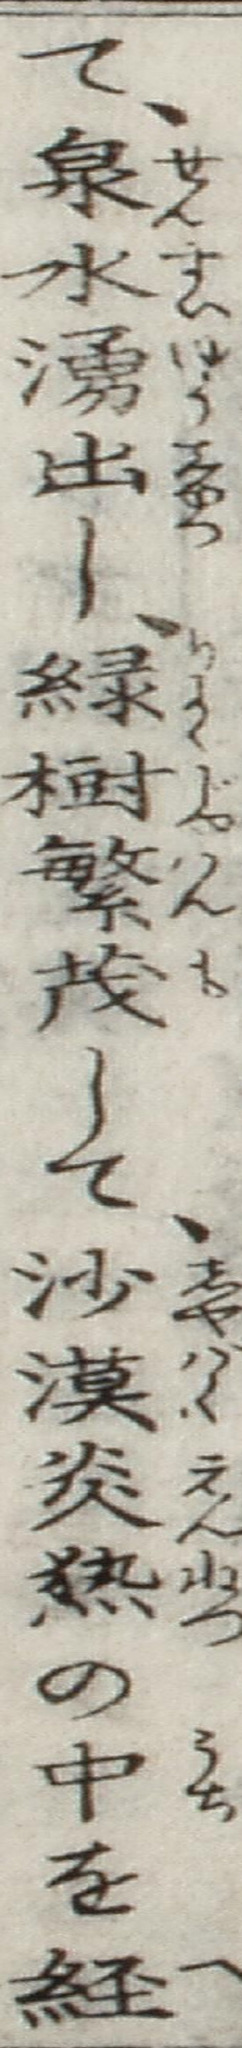て、泉水湧出し、緑樹繁茂して、沙漠炎熱の中を経
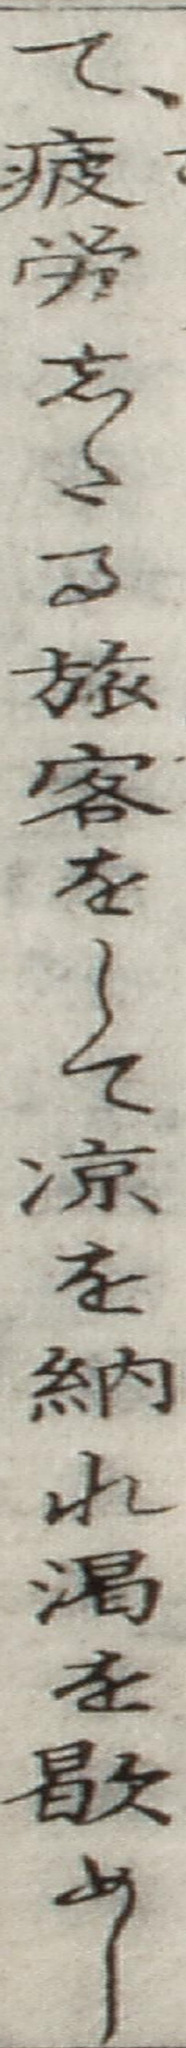て、疲労したる旅客をして、涼を納れ渇を歇めし

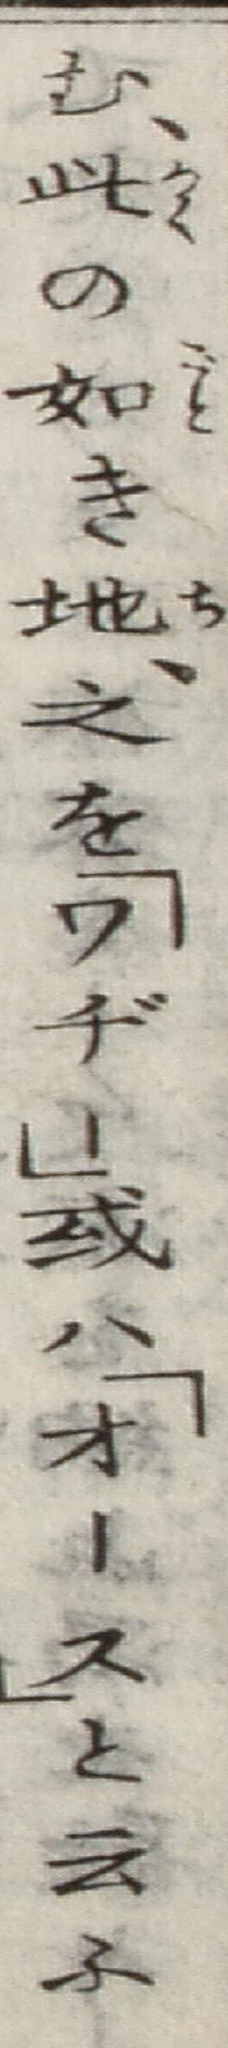む、此の如き地、之を「ワヂー」或は「オース」と云ふ
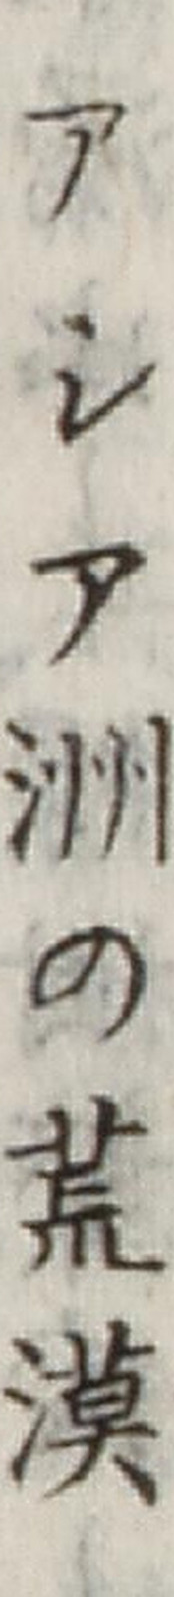アシア洲の荒漠
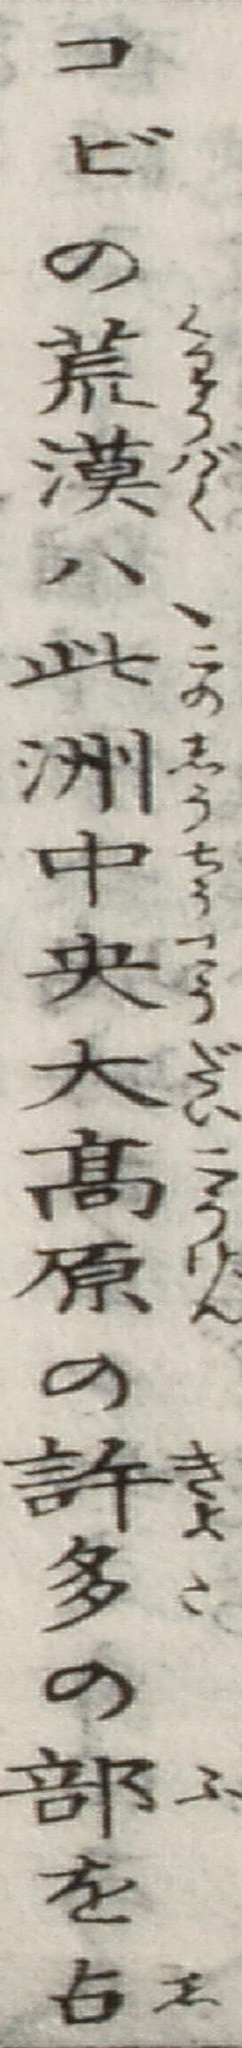コビの荒漠は、此洲中央大高原の許多の部を占
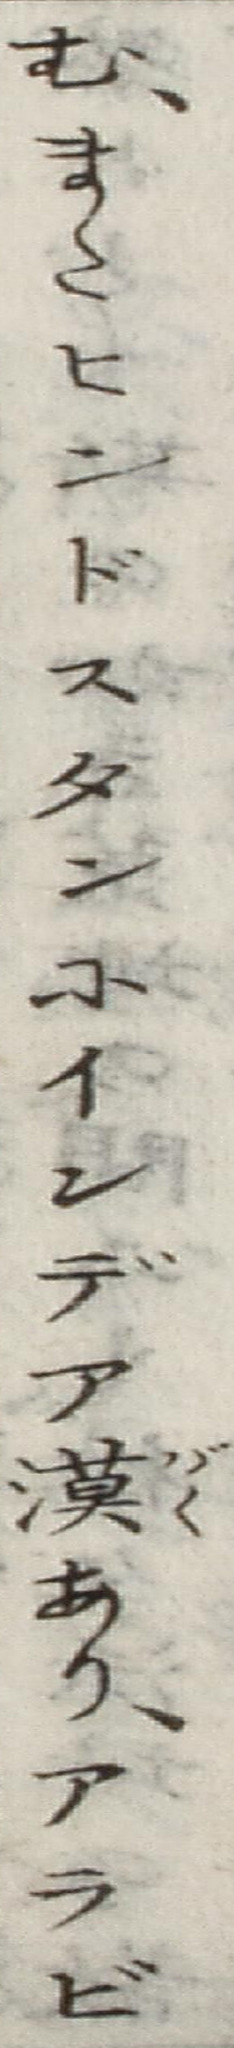む、またヒンドスタンにインデア漠あり、アラビ
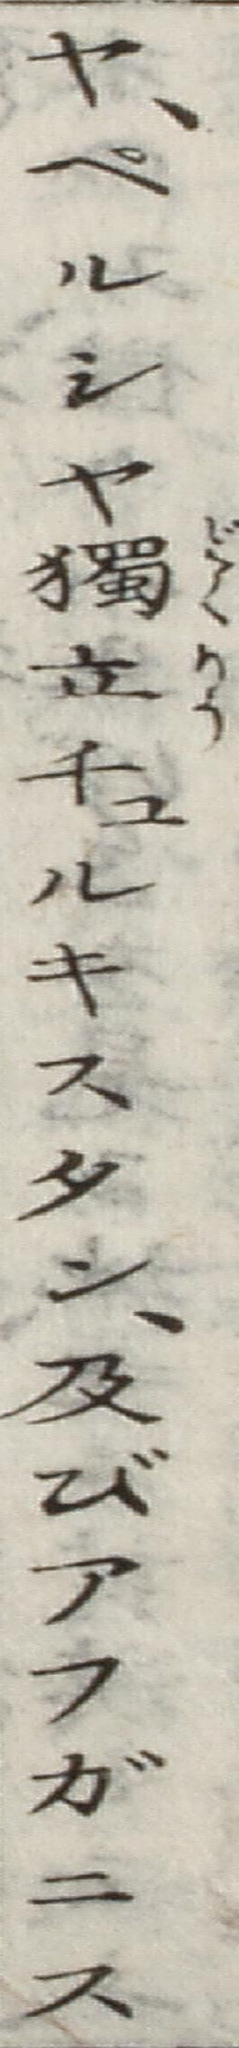ヤ、ペルシヤ独立チュルキスタン、及びアフガニス
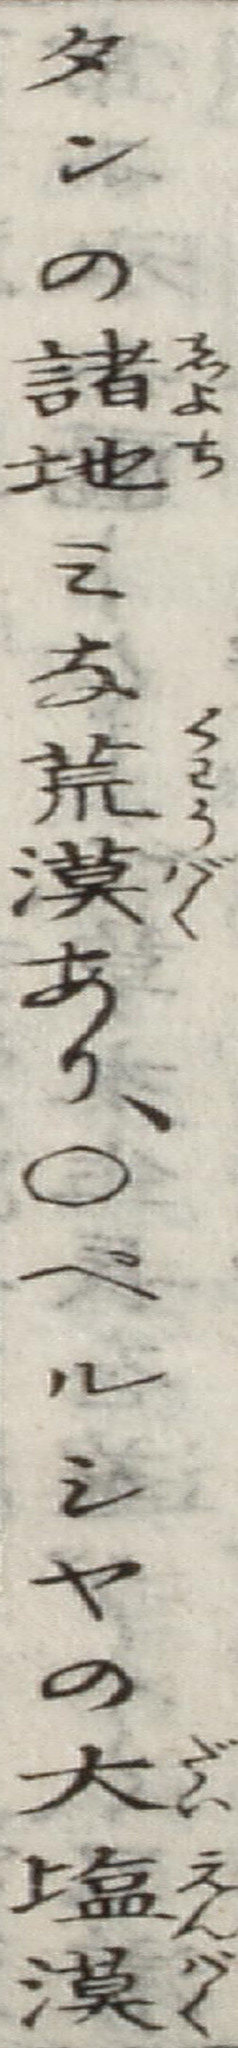タンの諸地みな荒漠あり、〇ペルシヤの大塩漠
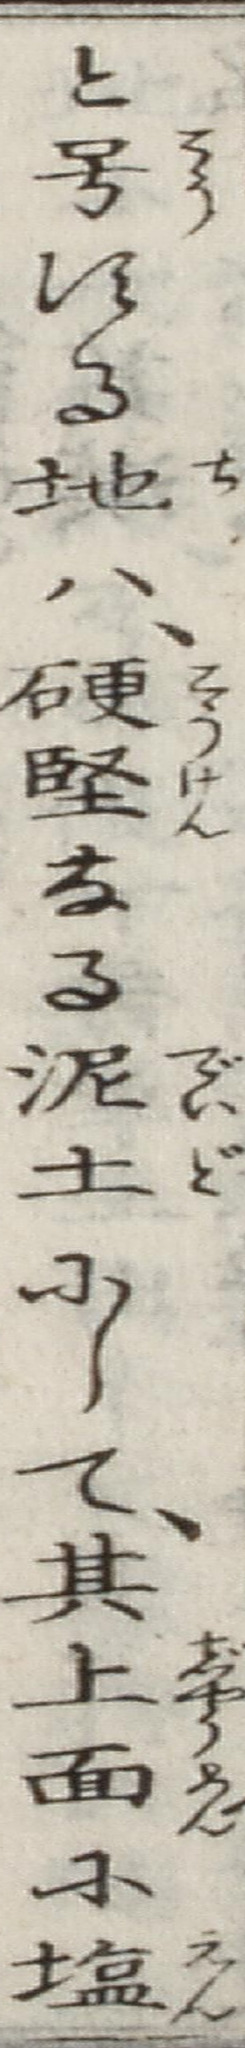と号する地は、硬堅なる泥土にして、其上面に塩
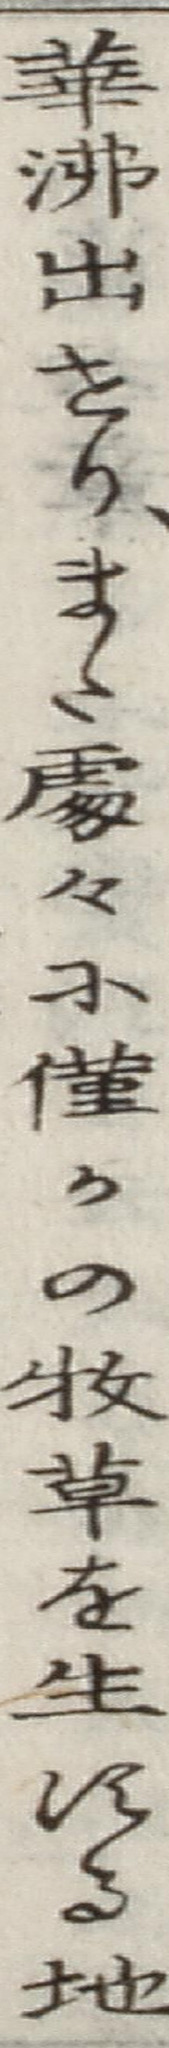華沸出せり、また𠁅々に僅かの牧草を生する地
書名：訓蒙　天然地理學　上
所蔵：東京大学地震研究所図書室 Earthquake Research Institute Library, The University of Tokyo, JAPAN
